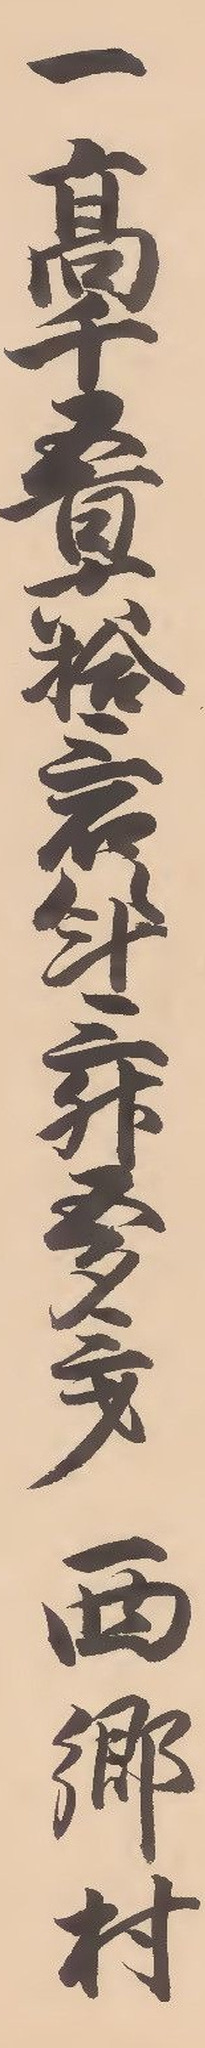一高千五百六拾三石八斗三升五勺三才西郷村
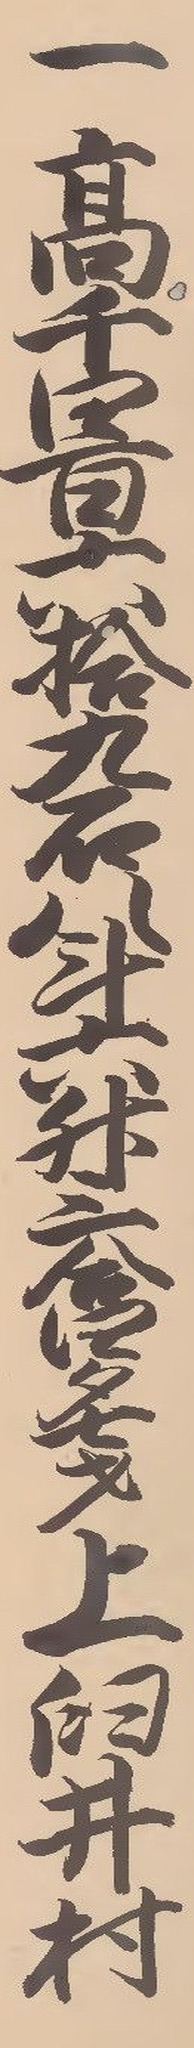一高千四百六拾九石八斗六升三合四勺七才上臼井村
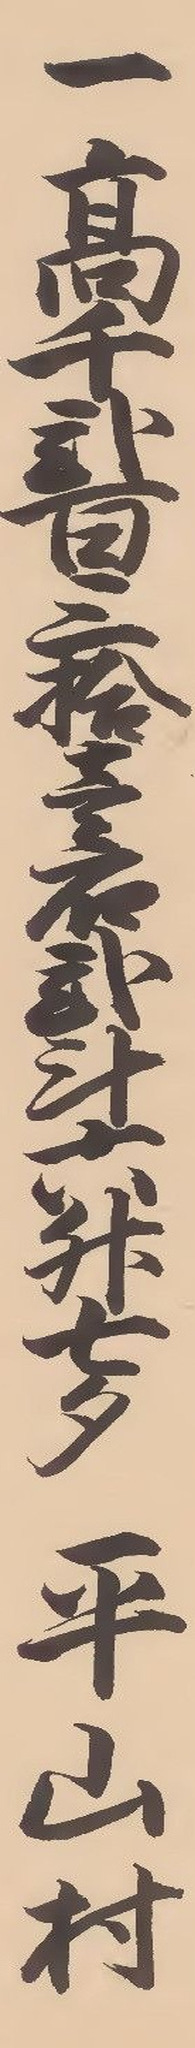一高千弐百三拾壱石弐斗六升七勺平山村
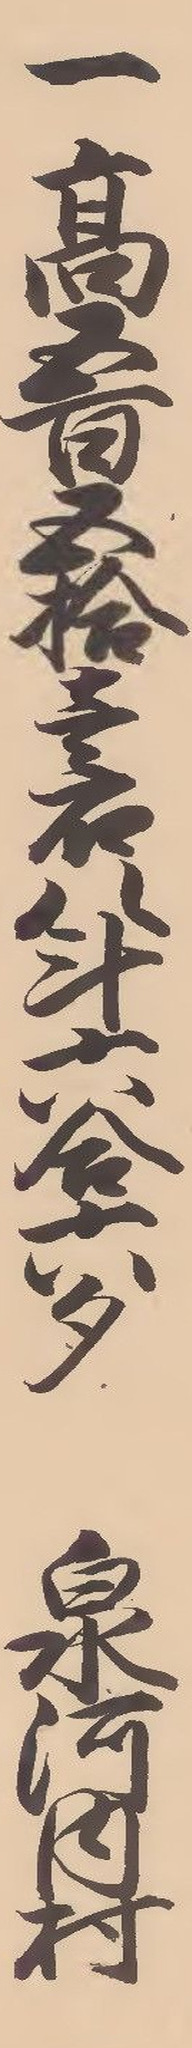一高五百五拾壱石八斗六合六勺泉河内村

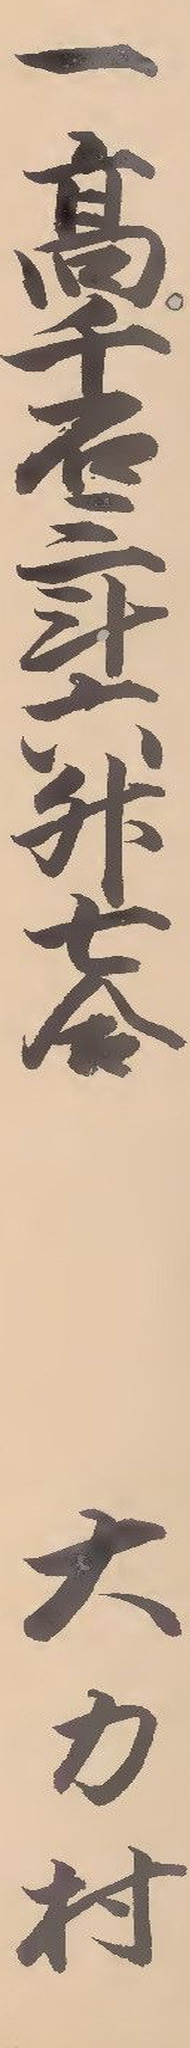一高千石三斗六升七合大力村
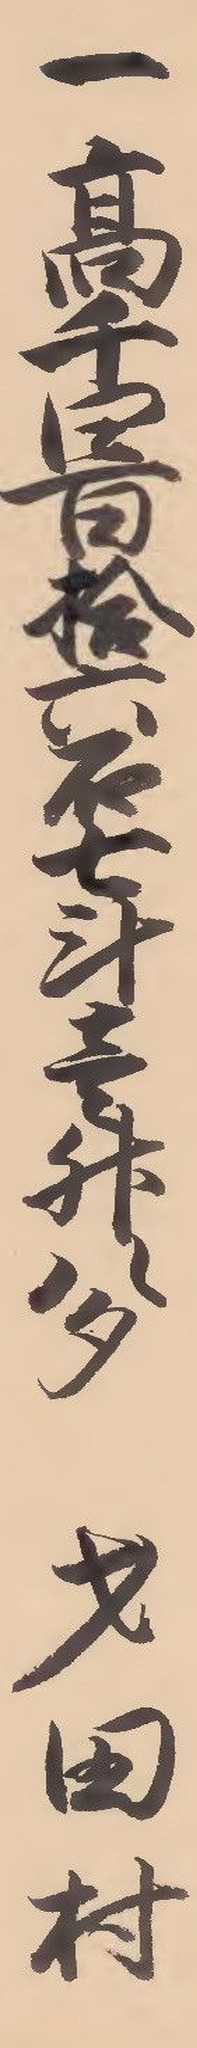一高千四百拾六石七斗壱升八勺才田村

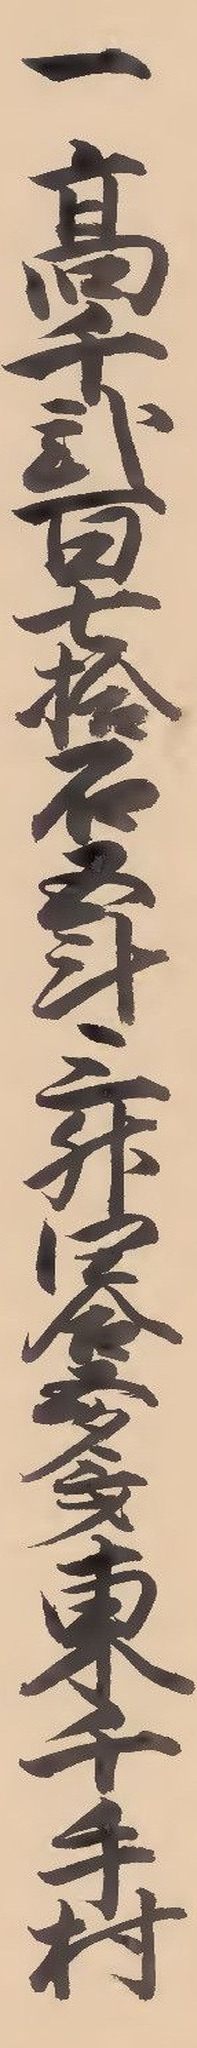一高千弐百七拾石五斗三升四合五勺三才東千手村
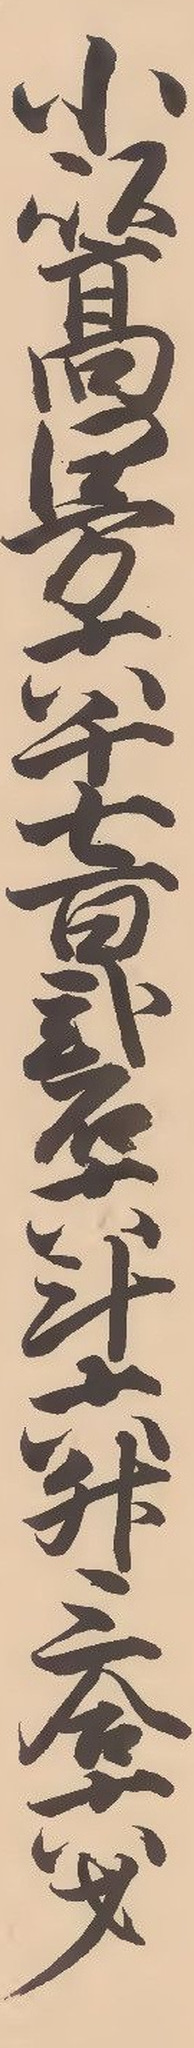小以高四万六千七百弐石六斗六升三合六才

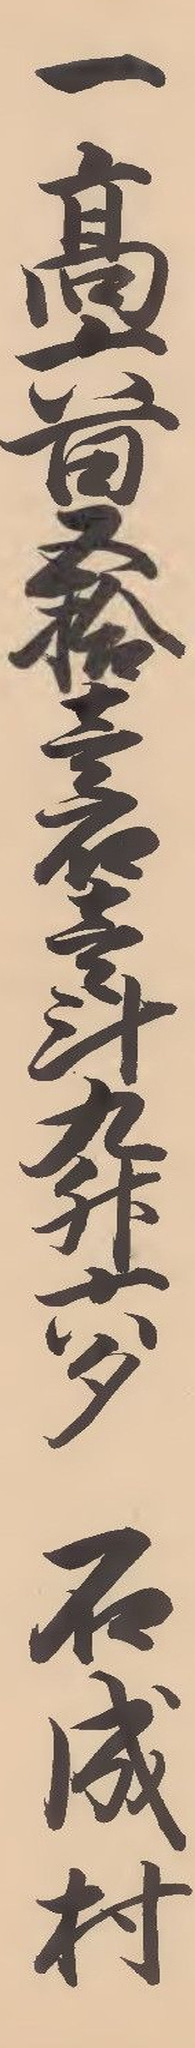一高六百五拾壱石壱斗九升六勺石成村
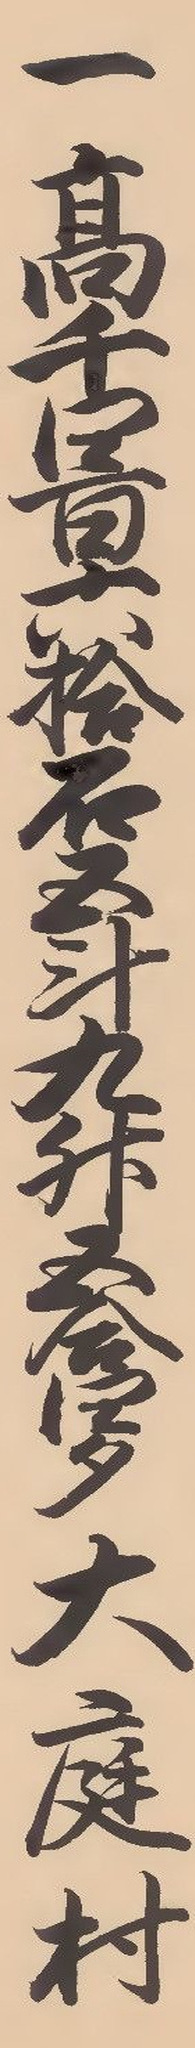一高千四百六拾石五斗九升五合四勺大庭村
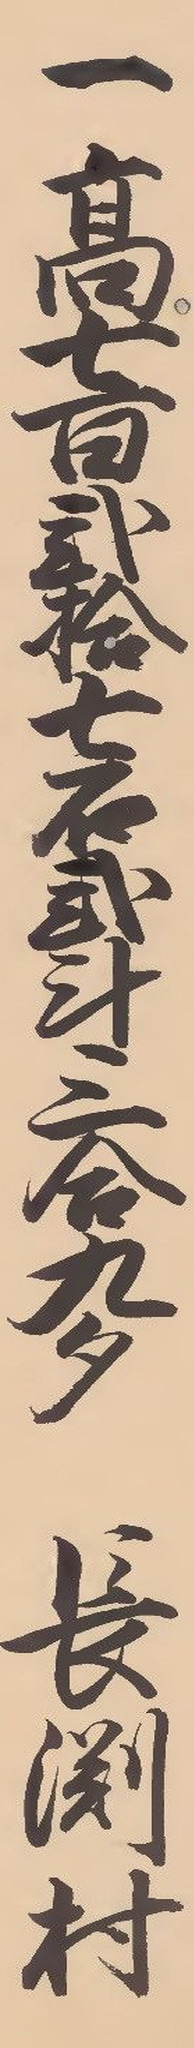一高七百弐拾七石弐斗三合九勺長渕村
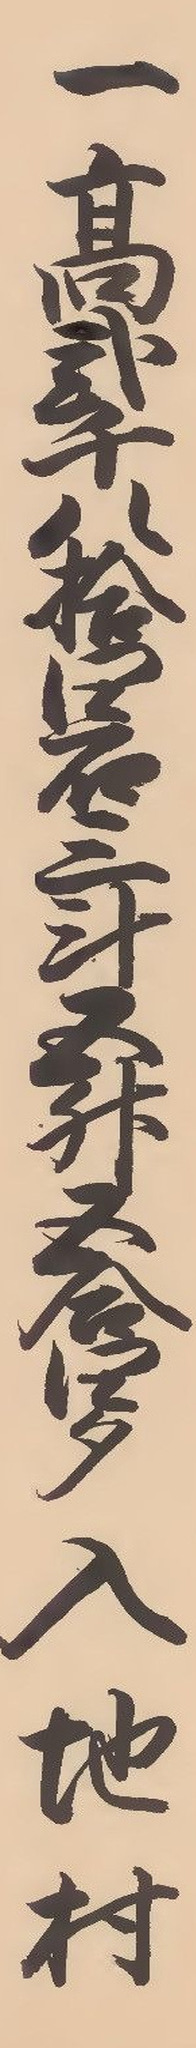一高弐千八拾四石三斗五升五合四勺入地村
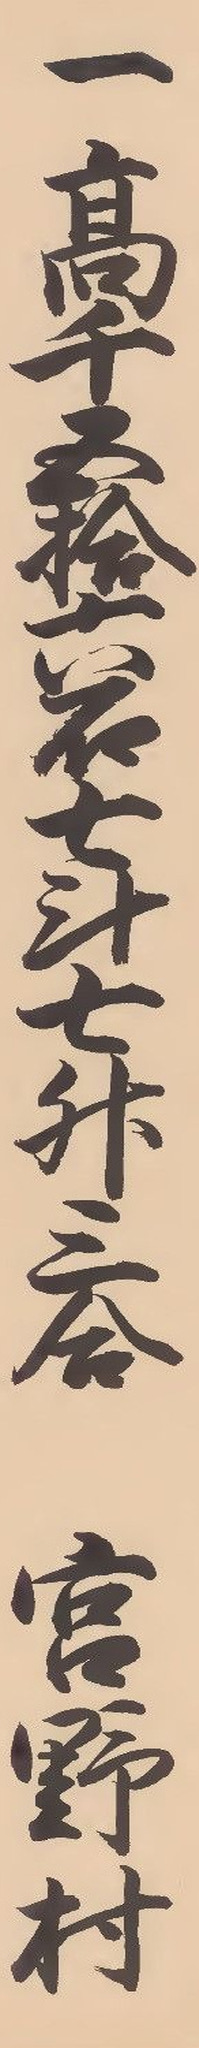一高千五拾六石七斗七升三合宮野村
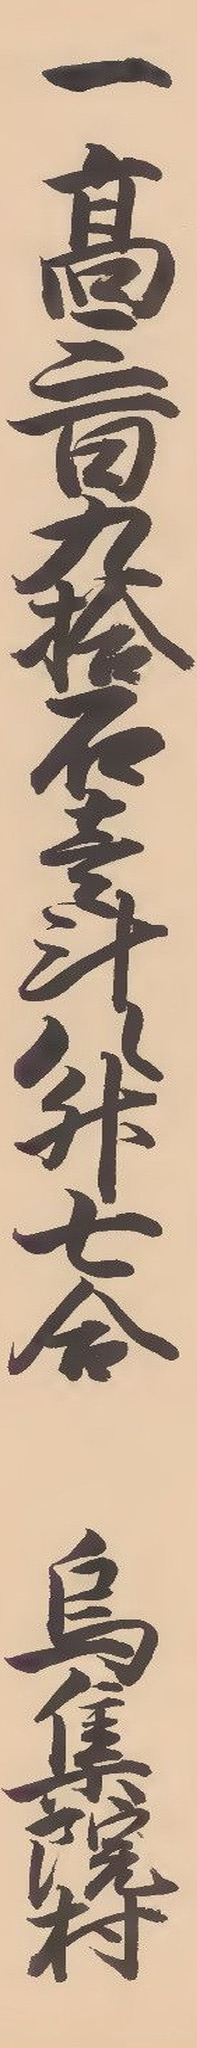一高三百九拾石壱斗八升七合烏集院村

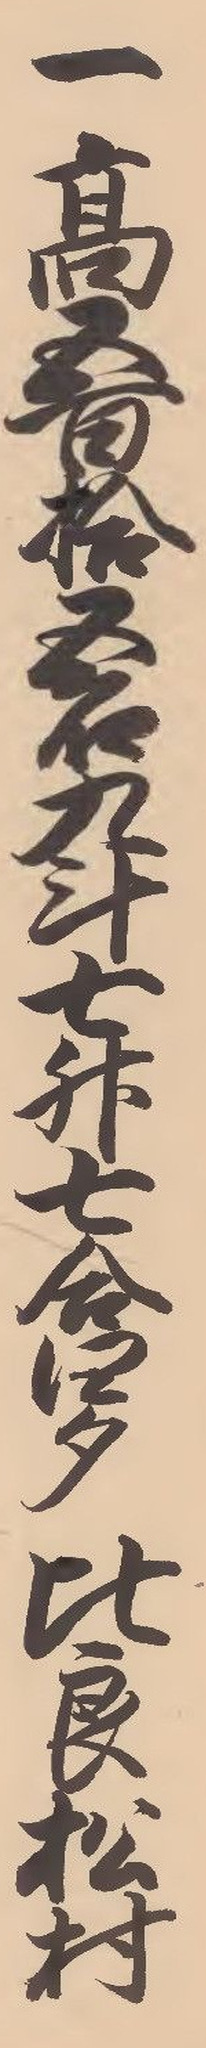一高五百拾五石九斗七升七合四勺比良松村
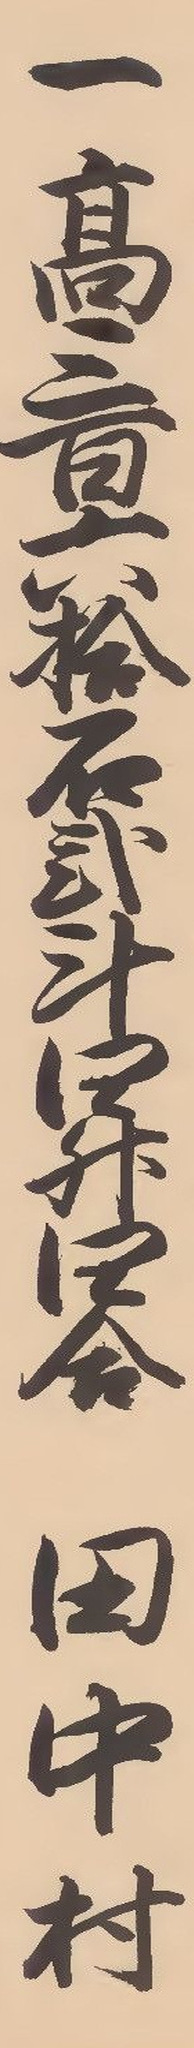一高三百六拾石弐斗四升四合田中村
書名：筑前国郷帳
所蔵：国立公文書館 National Archives of Japan
